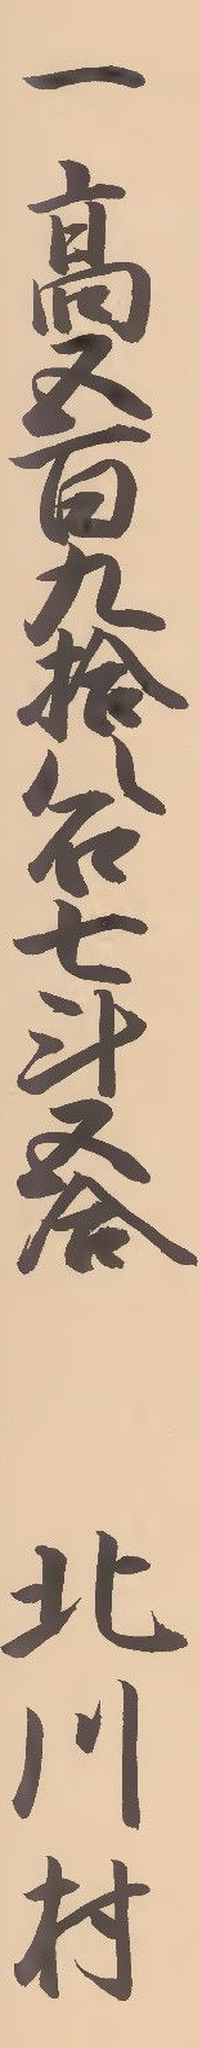一髙五百九拾八石七斗五合北川村
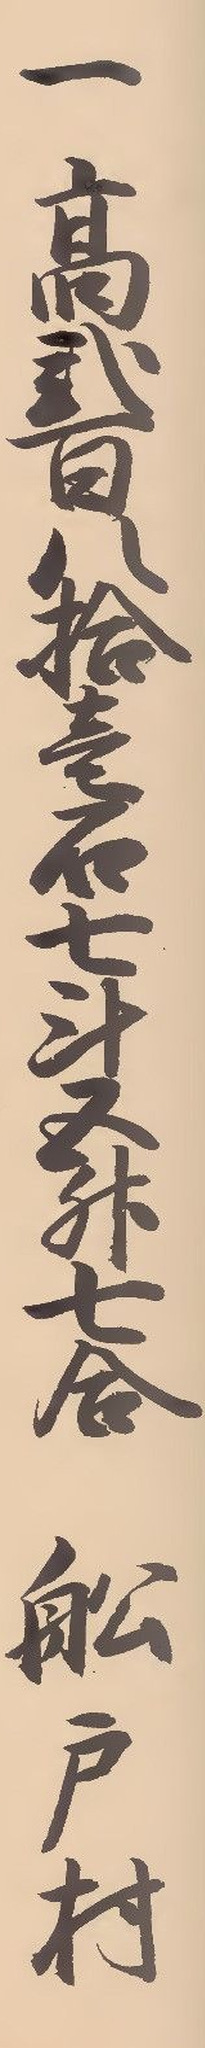一髙弐百八拾壱石七斗五升七合舩戸村
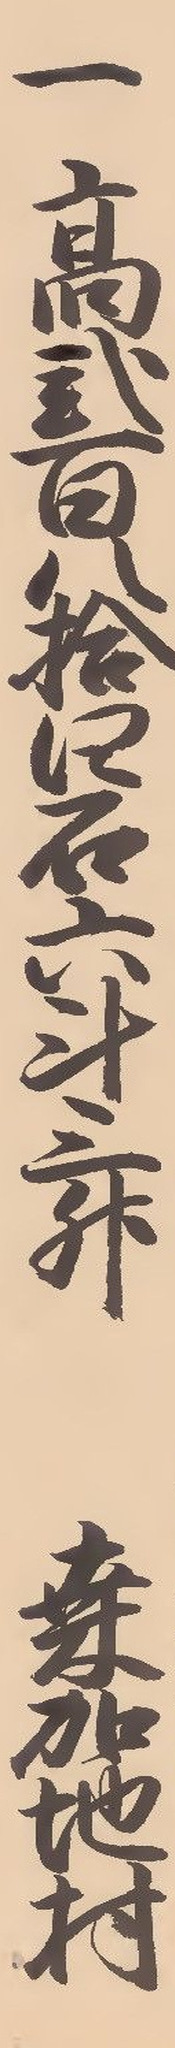一髙弐百八拾四石六斗三升桑加地村
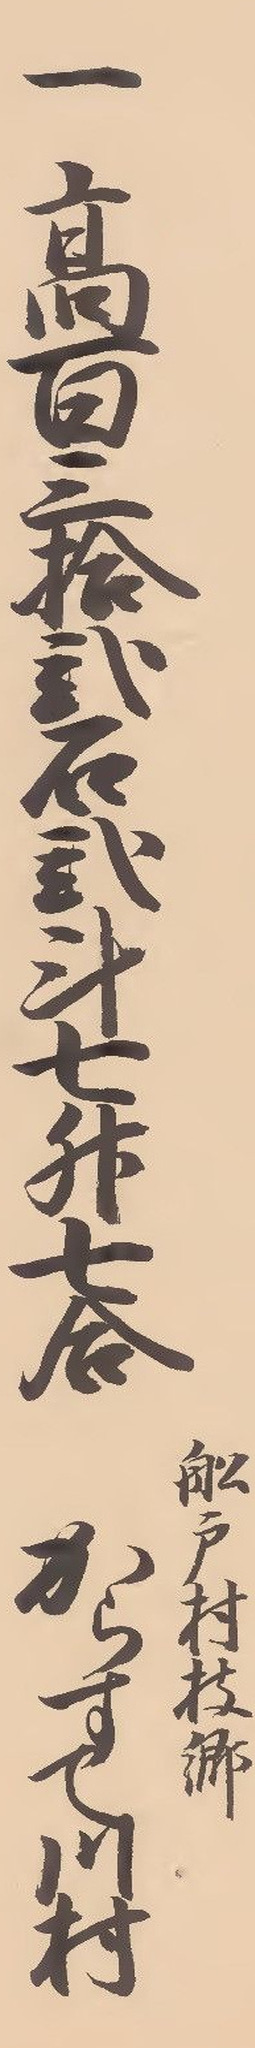一髙百三拾弐石弐斗七升七合からすて川村
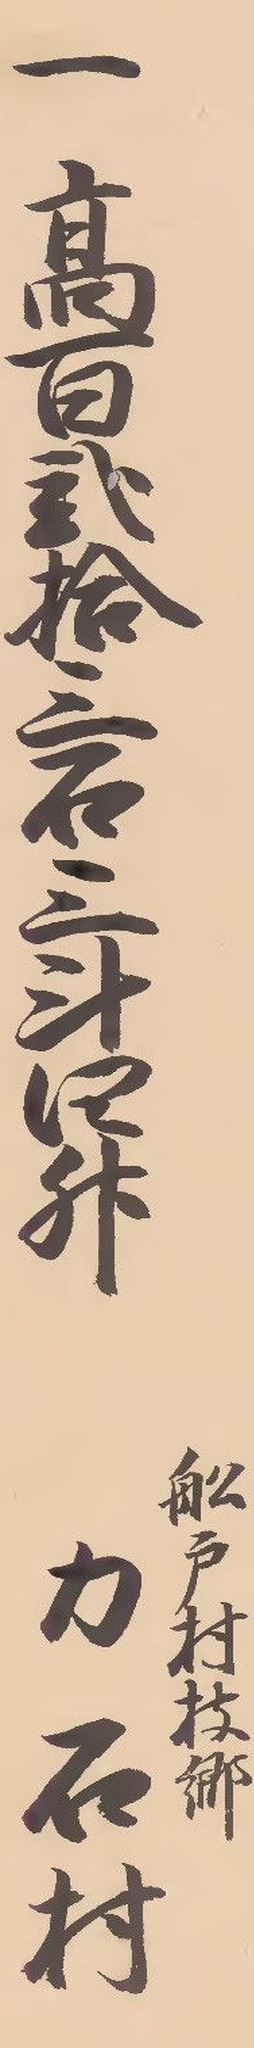一髙百弐拾三石三斗四升力石村

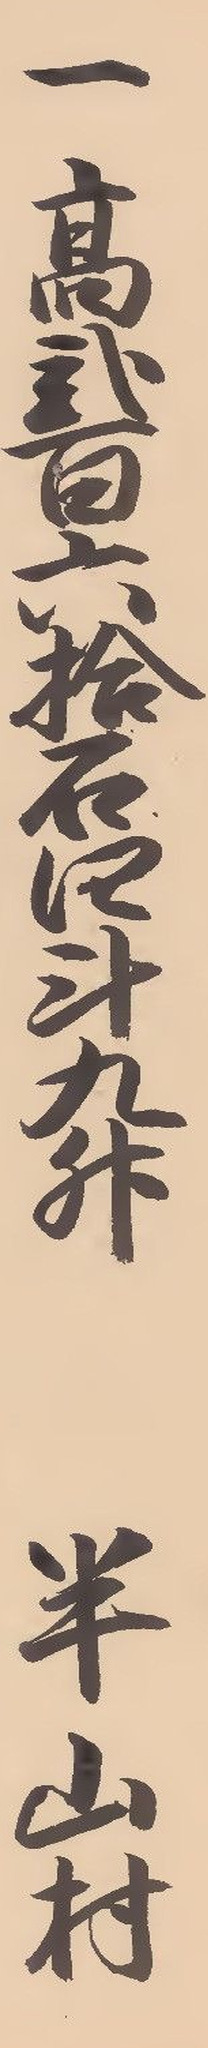一髙弐百六拾石四斗九升半山村
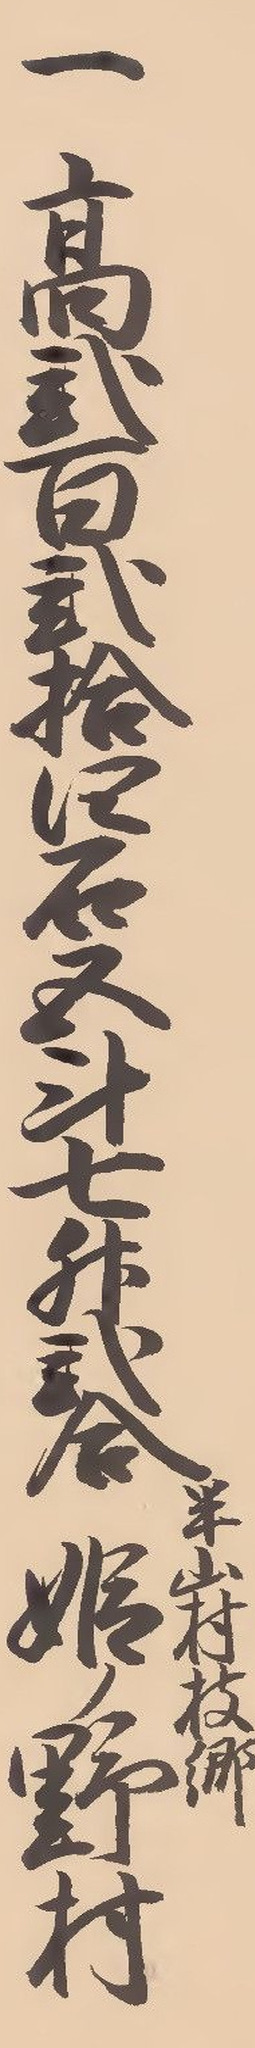一髙弐百弐拾四石五斗七升弐合姫ノ野村
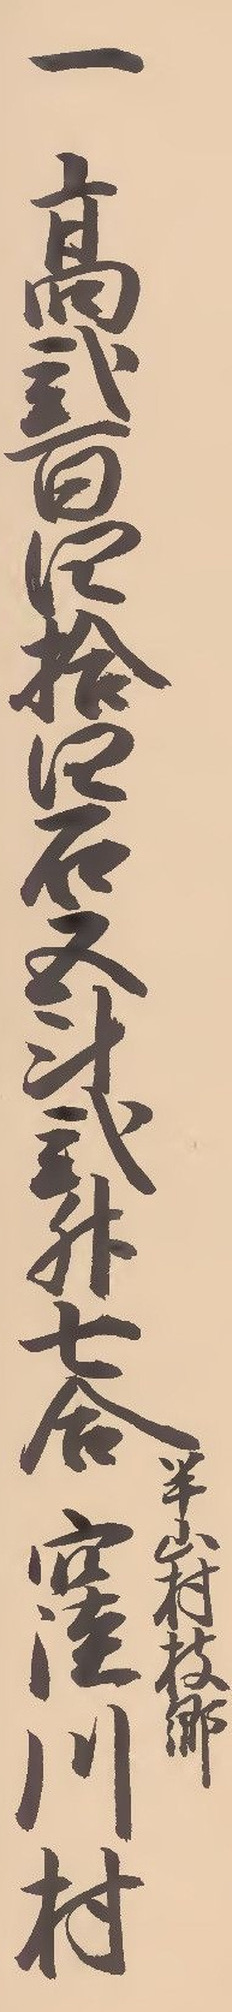一髙弐百四拾四石五斗弐升七合窪川村
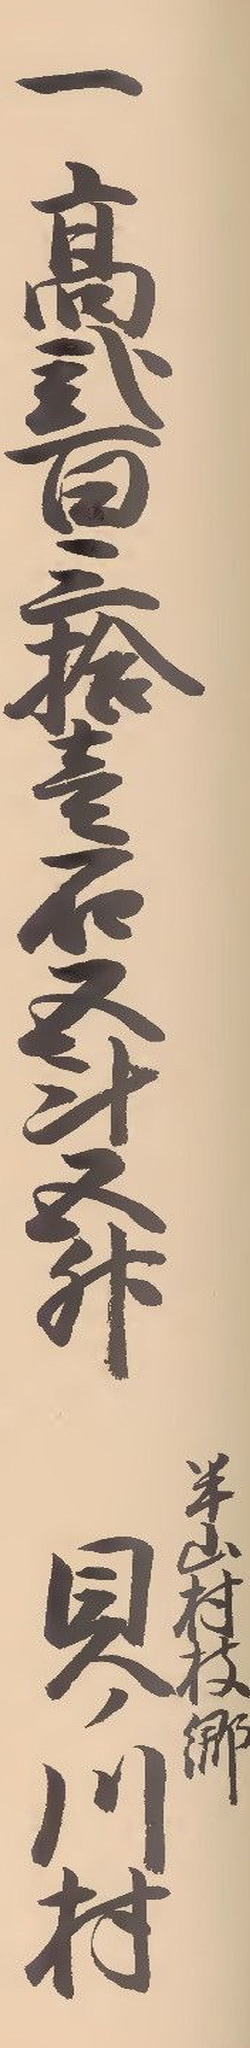一髙弐百三拾壱石五斗五升貝ノ川村
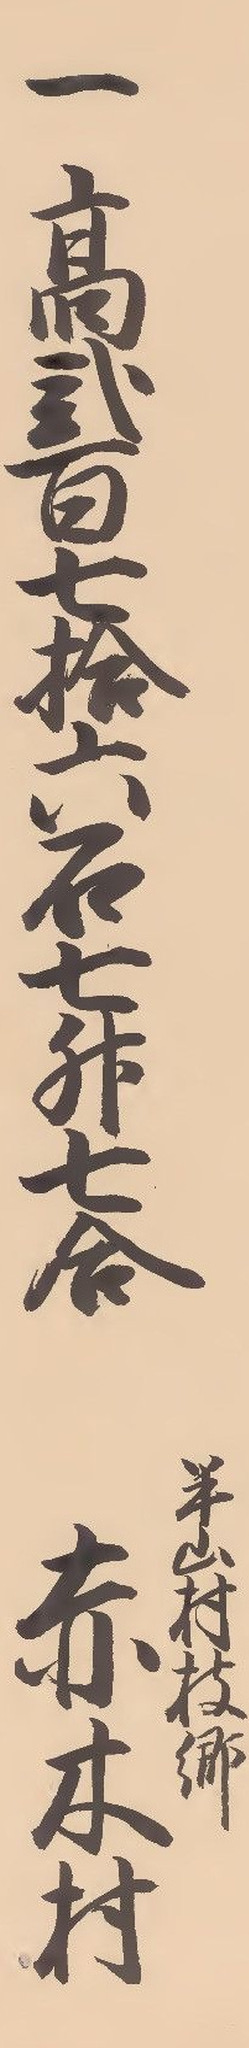一髙弐百七拾六石七升七合赤木村
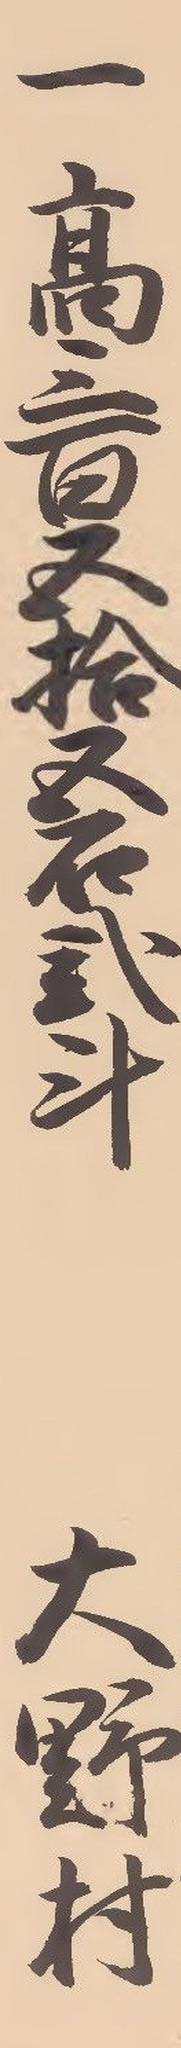一髙三百五拾五石弐斗大野村
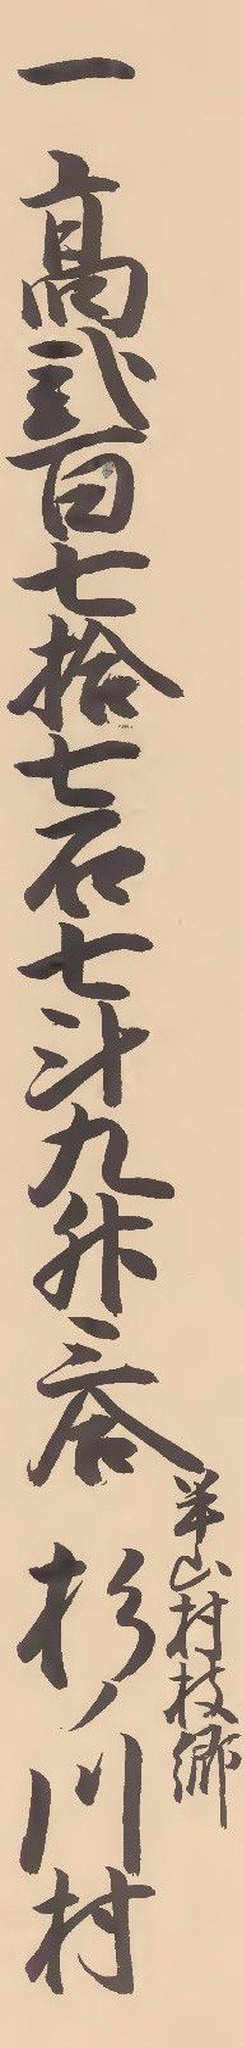一髙弐百七拾七石七斗九升三合杉ノ川村

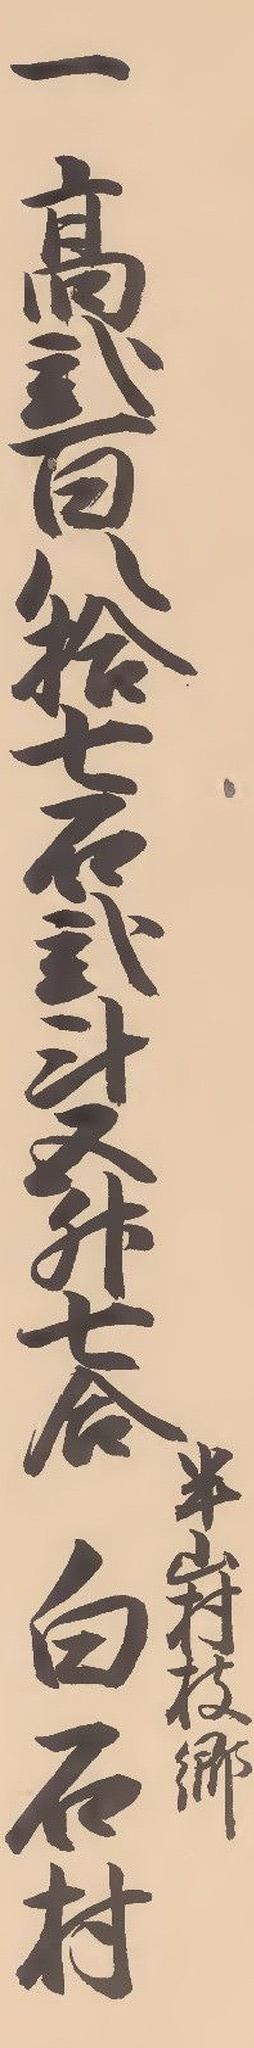一髙弐百八拾七石弐斗五升七合白石村
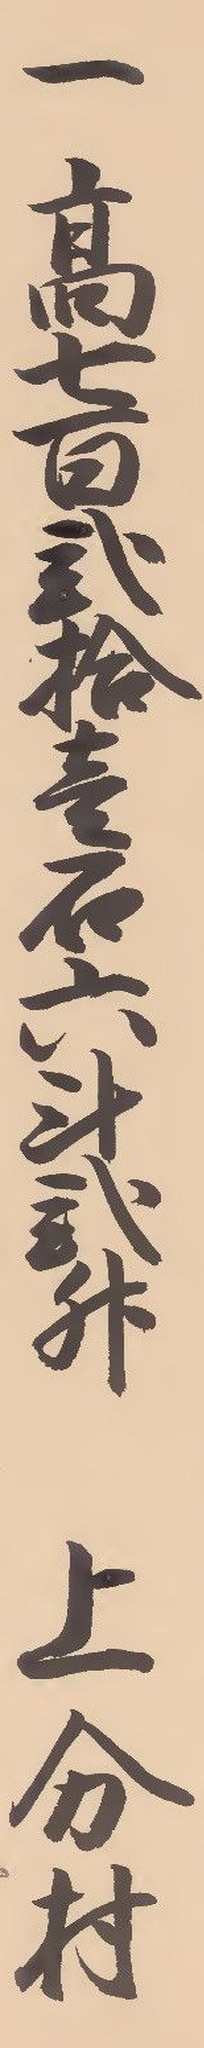一髙七百弐拾壱石六斗弐升上分村
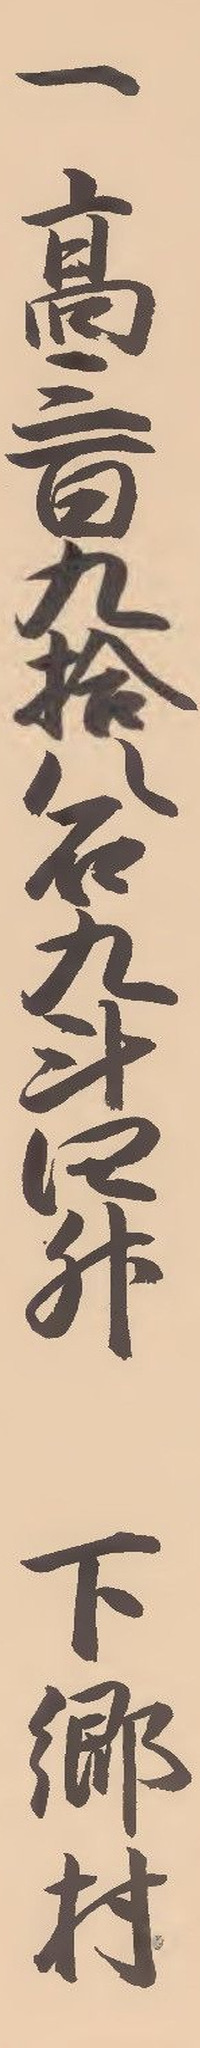一髙三百九拾八石九斗四升下郷村
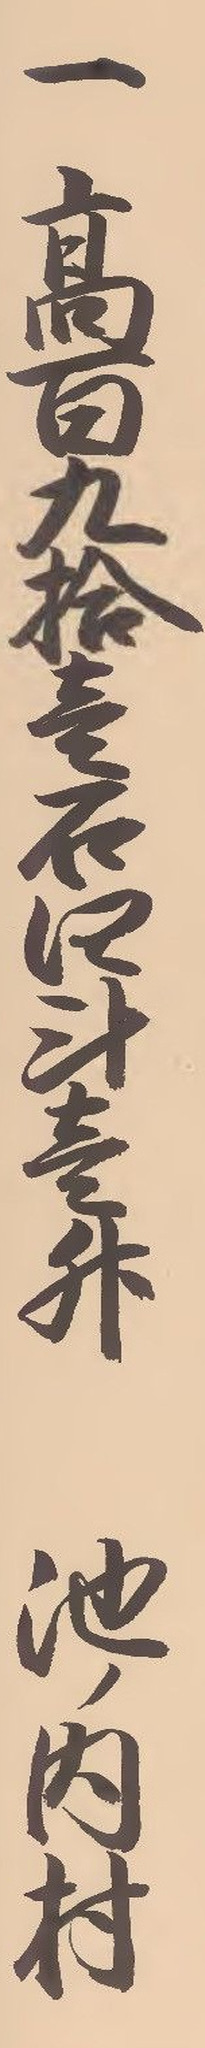一髙百九拾壱石四斗壱升池ノ内村
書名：土佐国郷帳
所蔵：国立公文書館 National Archives of Japan
